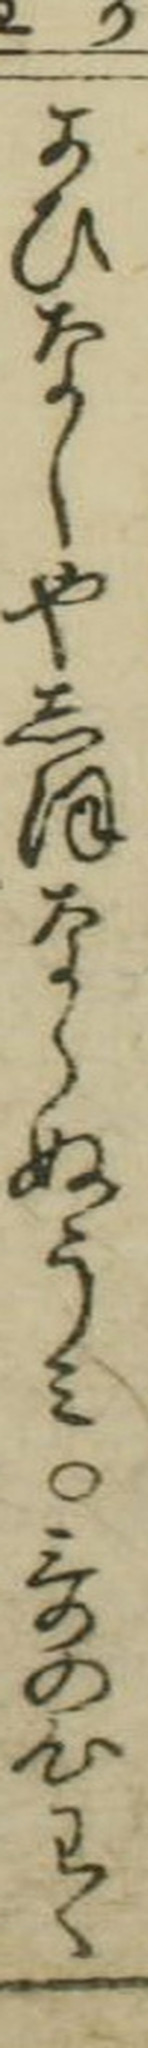かひなしやしほならぬうみ○哥の心わく
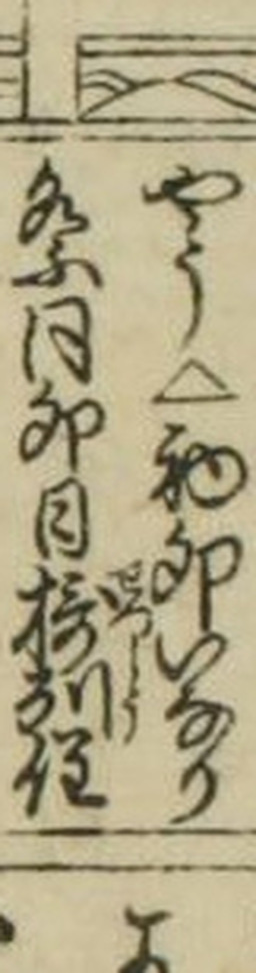祭同卯日摂州住
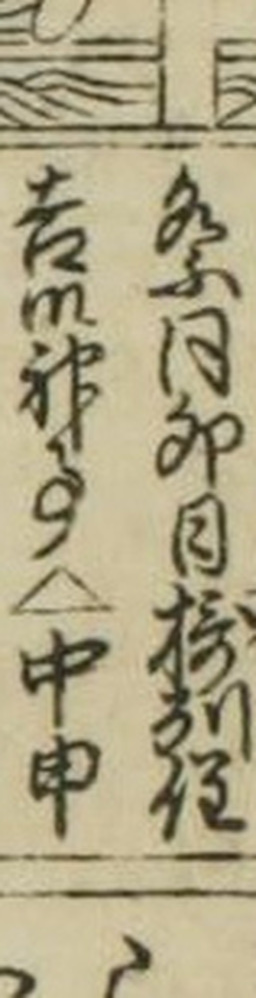吉御神事△中申
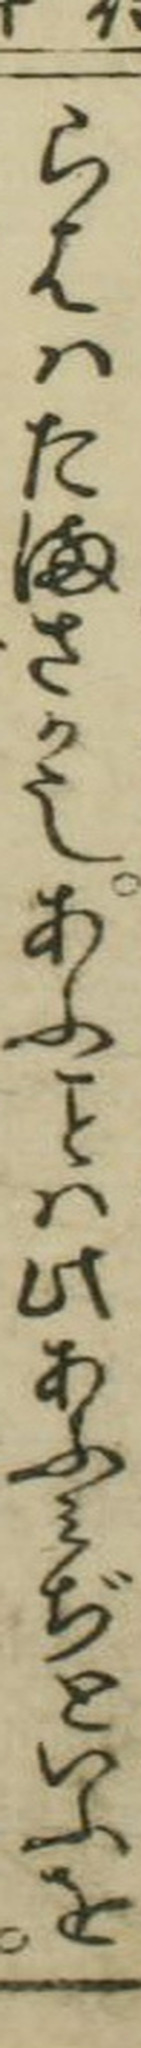らははたまさか也。あふことは此あふみぢといふを
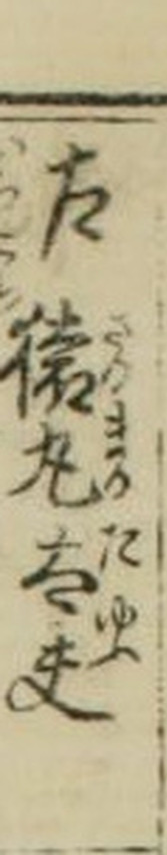左猿丸大夫
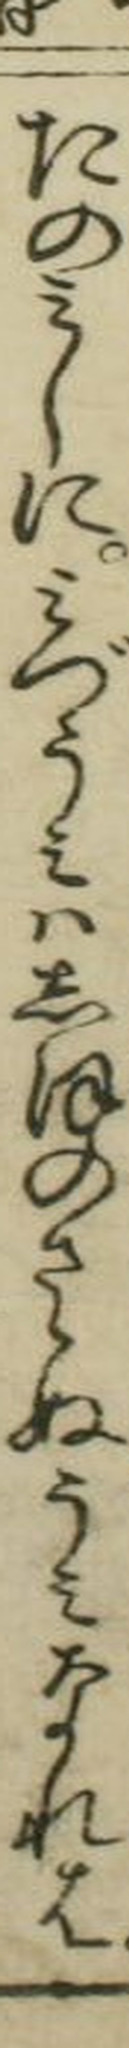たのしみに。みづうみはしほのさらぬうみなれは。
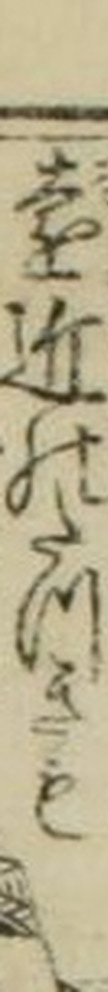遠近のたつきも
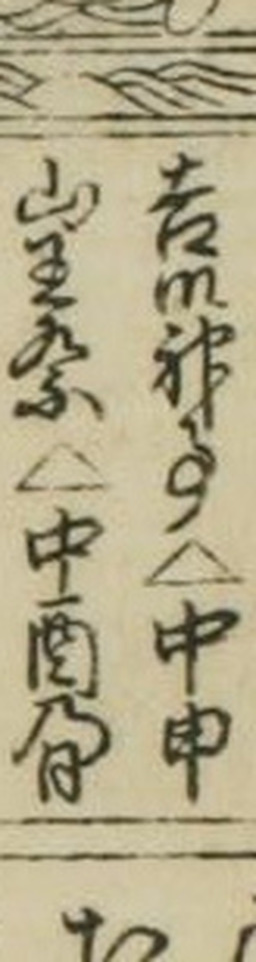山王祭△中酉の日
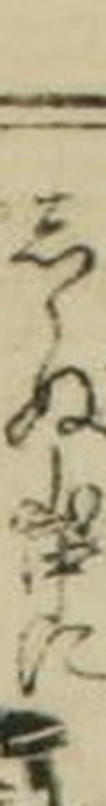しらぬ山中に
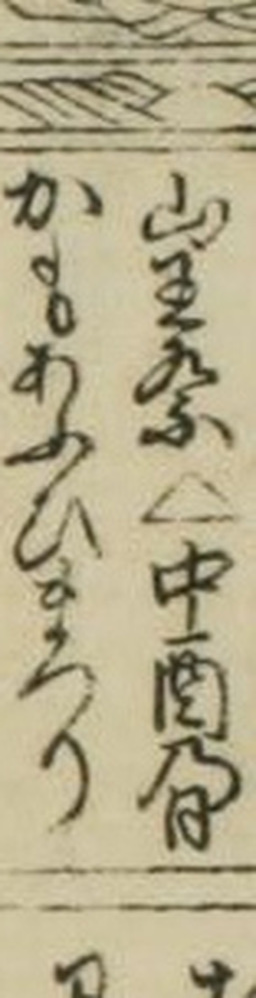かもあふひまつり
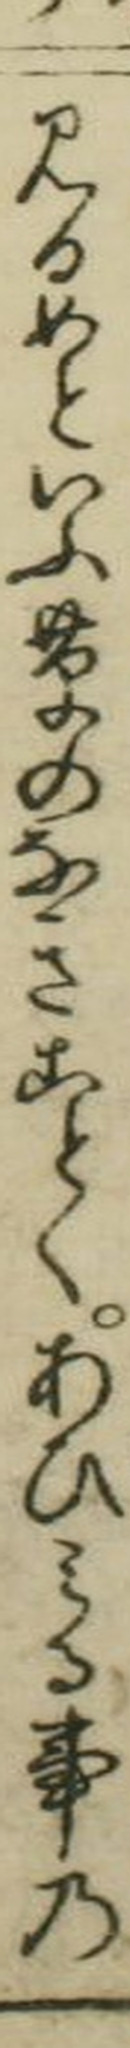みるめといふ草のなきことく。あひみる事の
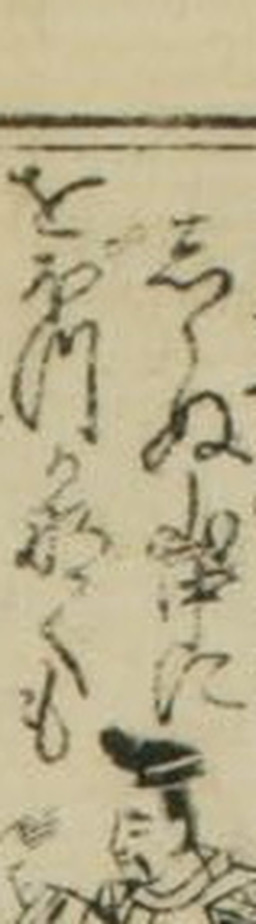をぼつかなくも
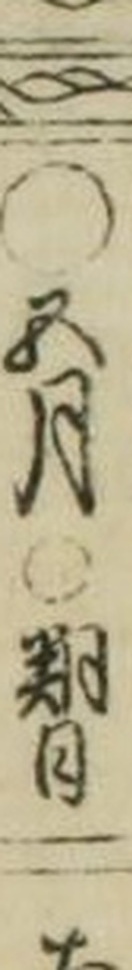○五月◯朔日
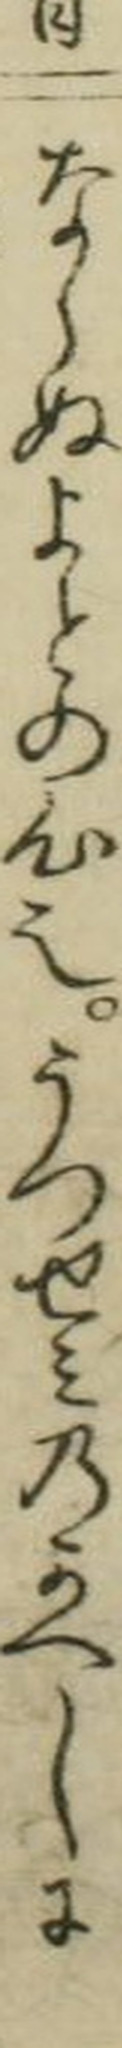ならぬよとの心也。うつせみのかへしに
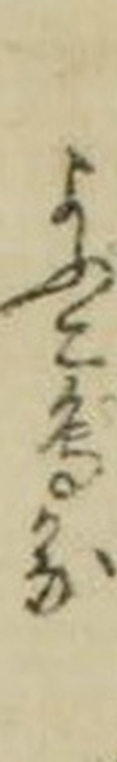呼ぶこ鳥かな
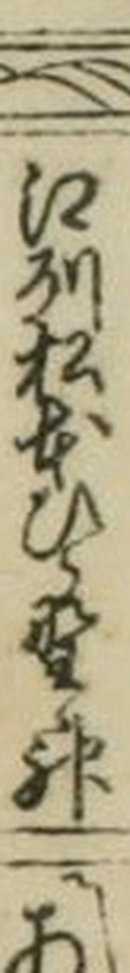江州松本ひら野ゝ神
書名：女源氏教訓鑑
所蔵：東京学芸大学附属図書館
